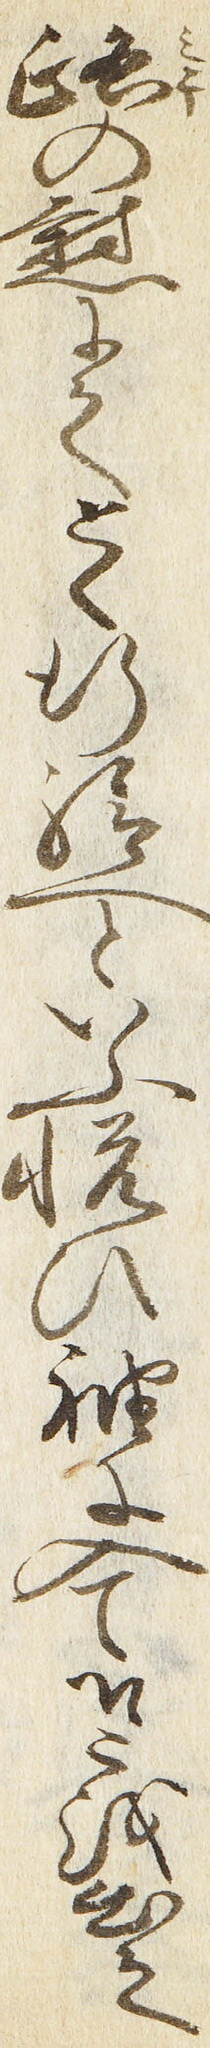路の慰にてとく行給へといふ悦ひ袖に入てそこを出て
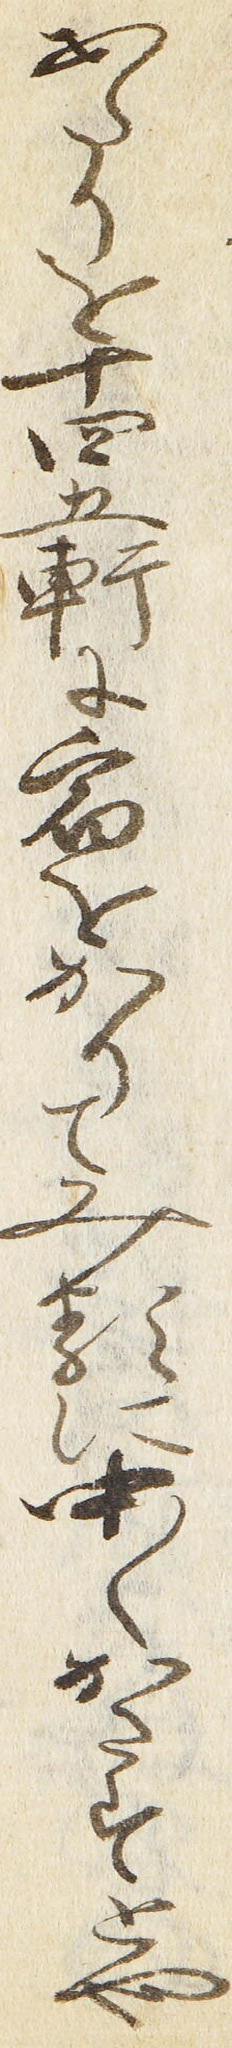あたりを十四五軒に宿をかりてみるに中〳〵かさすとや
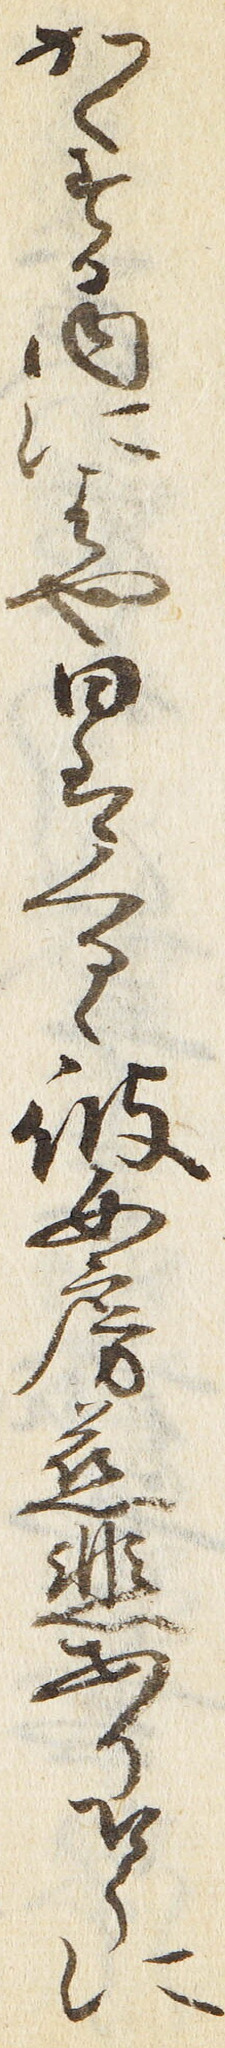かくする内にはや日はくるゝ彼女房慈悲ありそうに
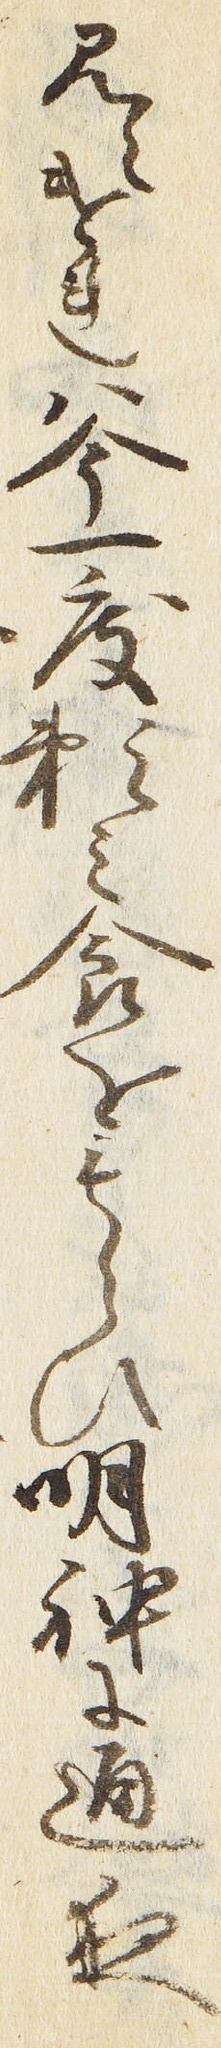見えけれは今一度頼み食をもらひ明神に通夜
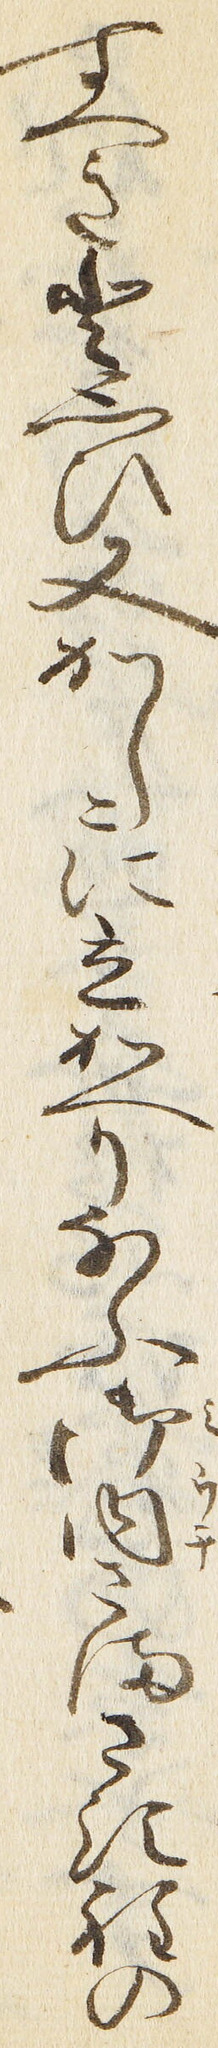すへきと思ひ又かしこに立かへりなふ御内さまさき程の
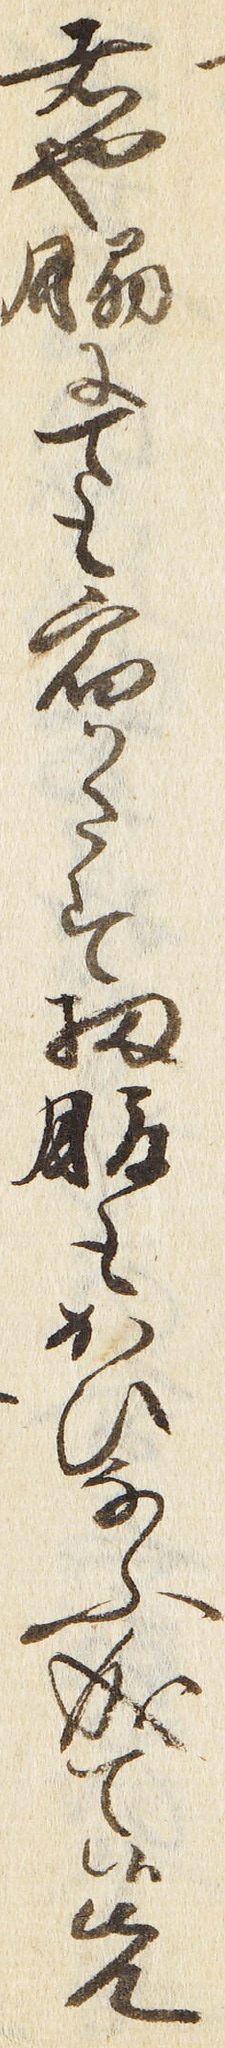者也脇にても宿かさす扨服もかひなふ成て候先
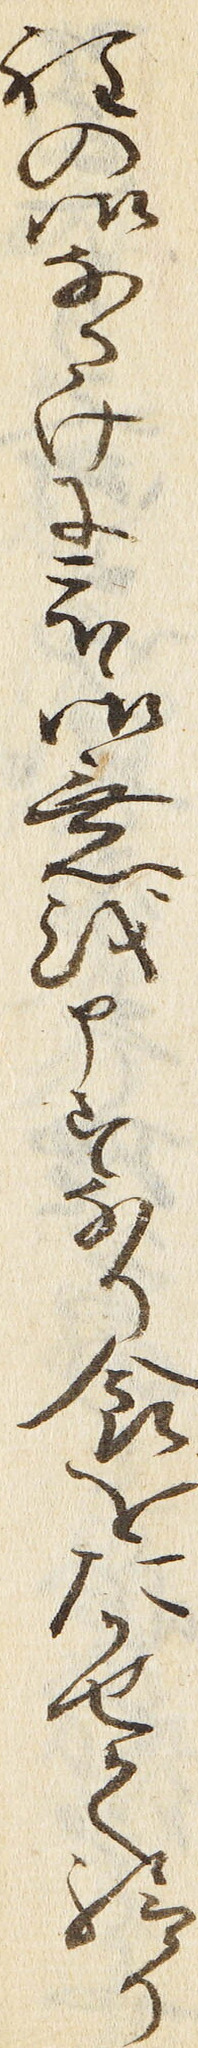程の御なさけにこそ御無心を申すなり食をたかせて給り
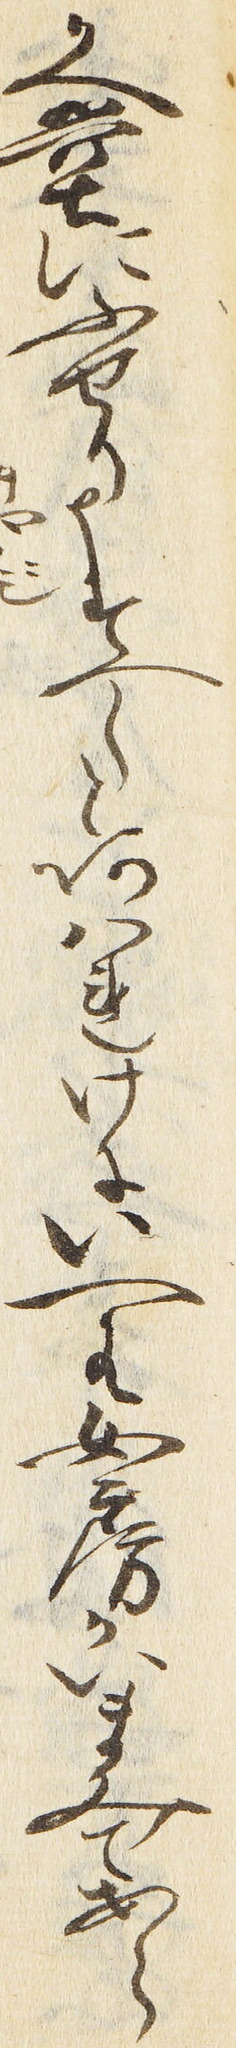かへ堂にふせり申すへしとあはれけにいへは女房かいまみてあら
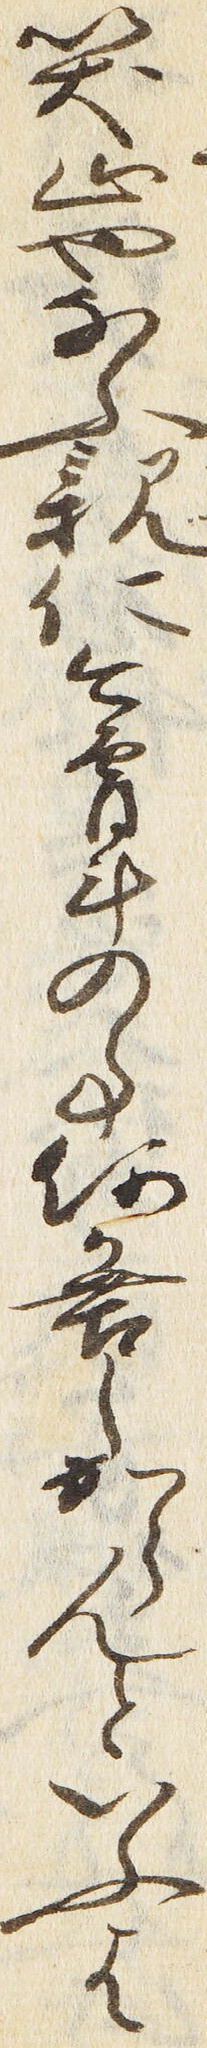笑止やなふ親仁今宵計の事何か苦しからんといふは
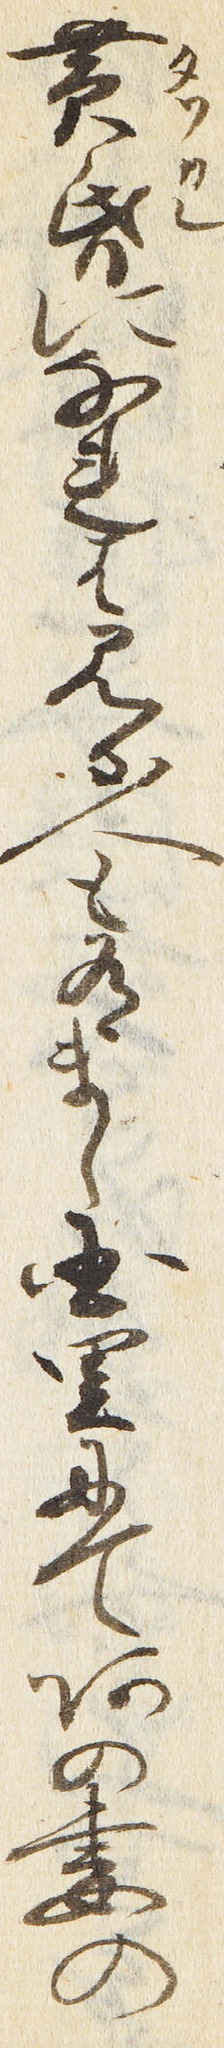黄昏になれは見る人も有まし国里にてあの妻の
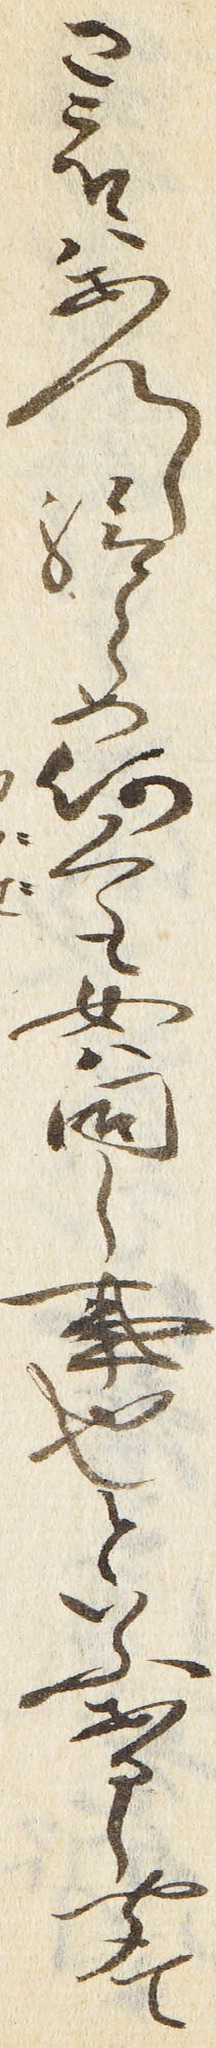さこそはあんし給しめ何人も女は同し事也といふあるし聞て
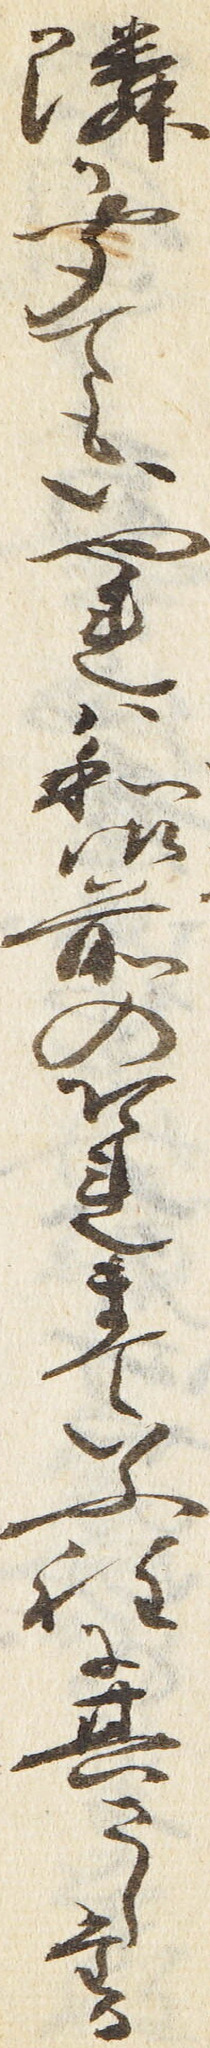隣か聞てもいやれは和御前のそれまていふ程に其さしたる
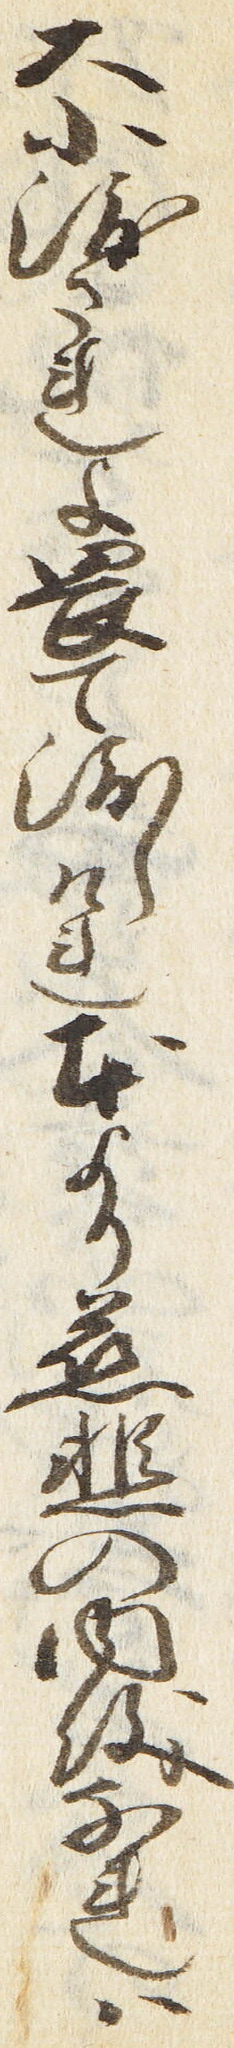大小渡されよ畏て渡しけれ本より慈悲の内儀なれは
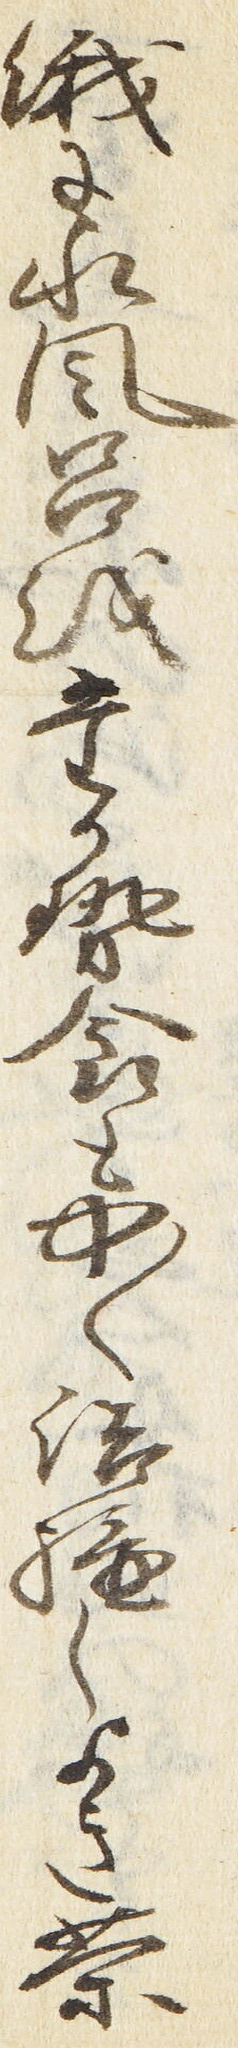俄に水風呂をたかせ食も中〳〵結構しよき菜
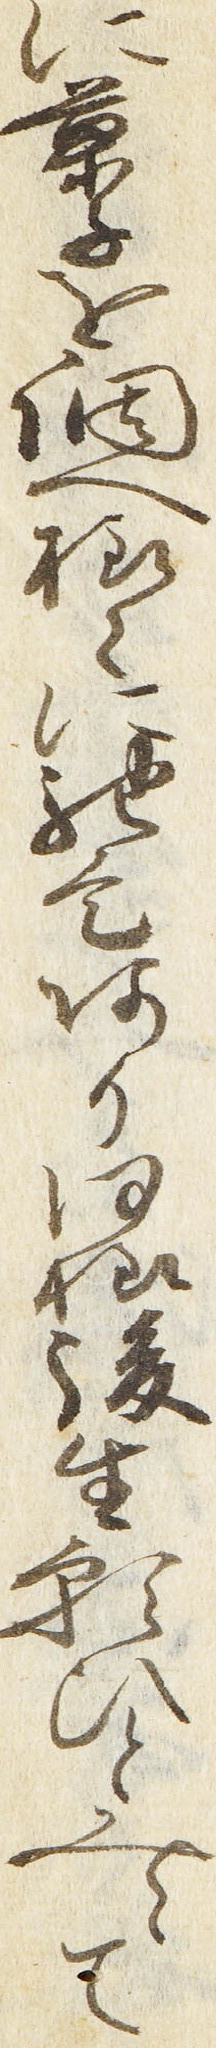に菓子を調へ様々に馳走あり同様後生願ひとみえて
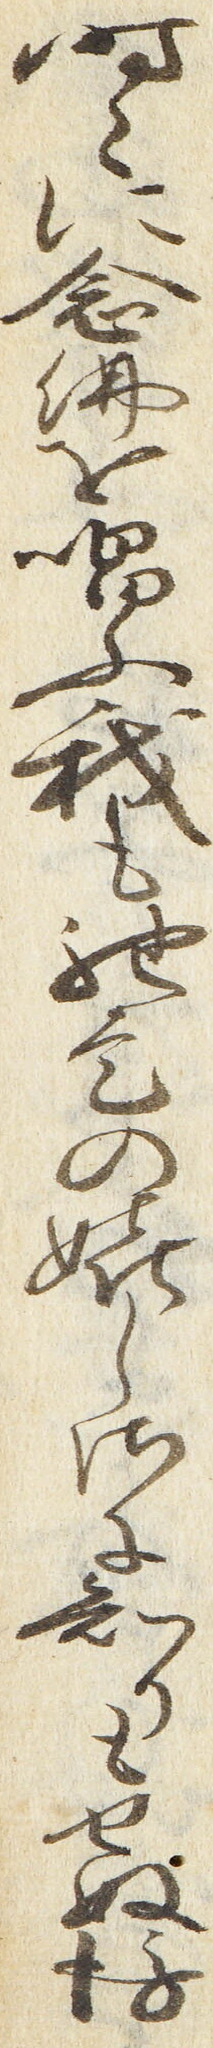時々に念仏を唱ふ我も馳走の嬉しさに知りもせぬ後
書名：海陸世話日記
